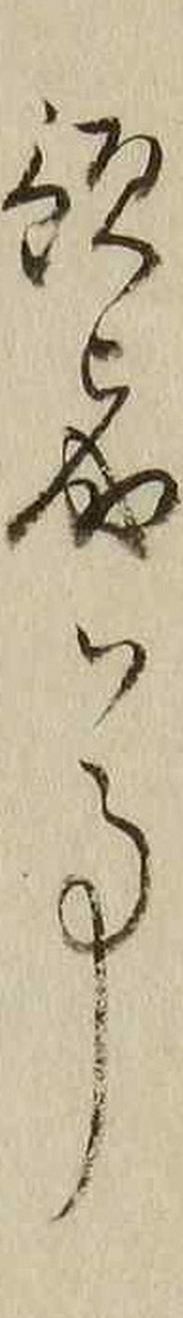預被成候事
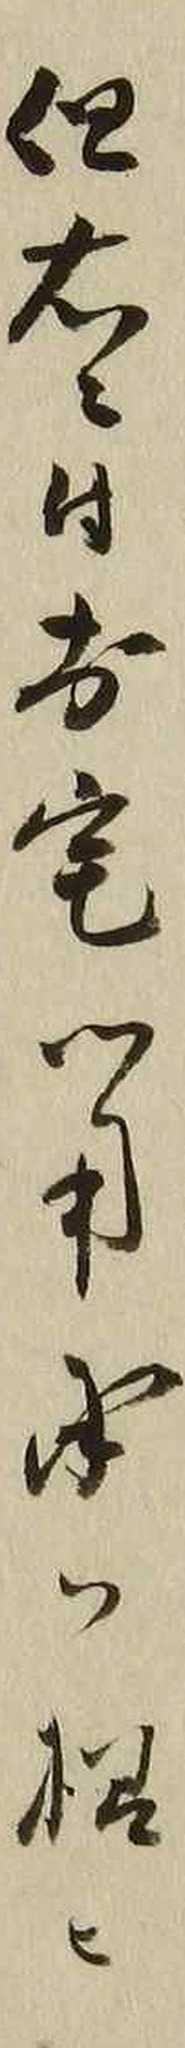但右に付於宅御用承候様被
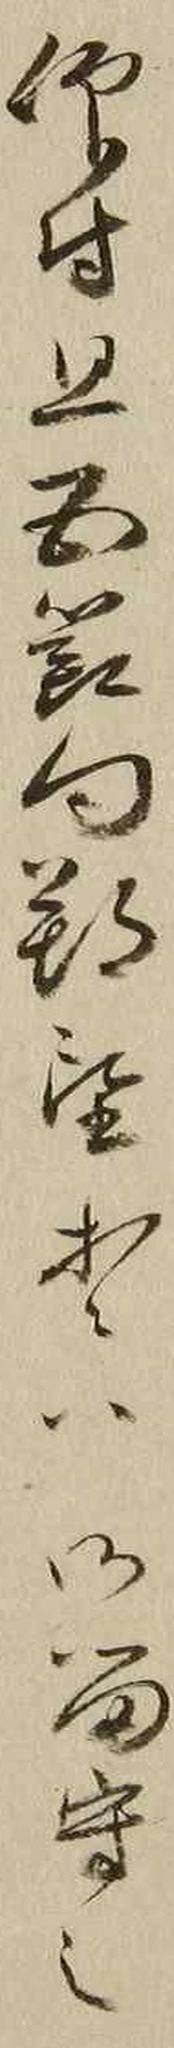仰付且五節句朔望等には御留守之
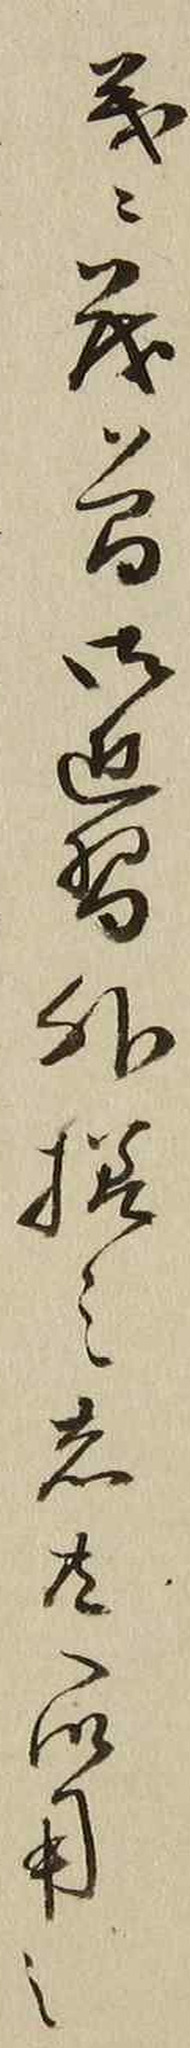義にも候間御近習外様之者共へ御用之
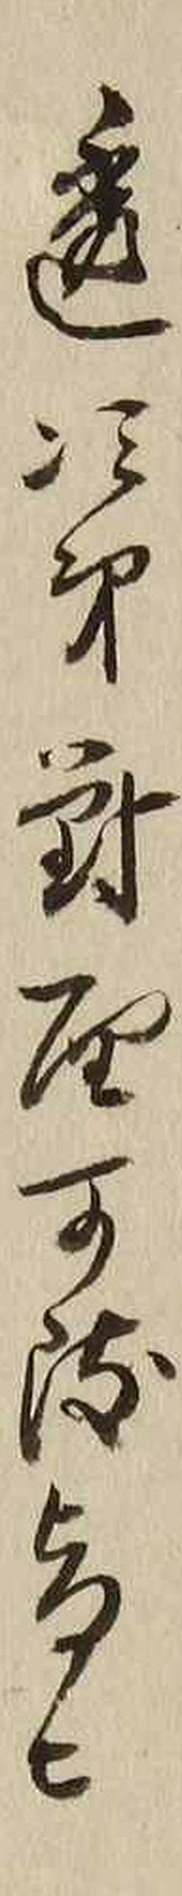透次第対面可致旨被
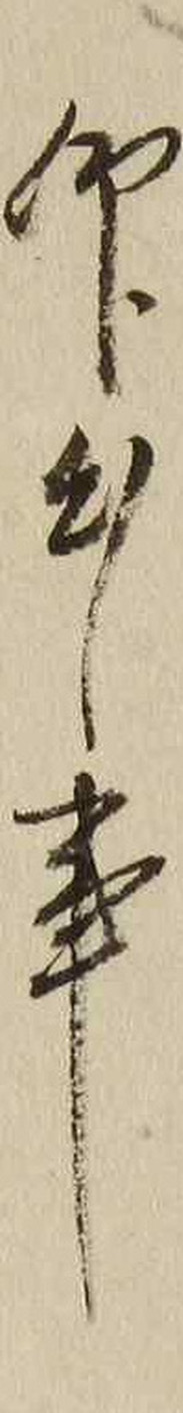仰出候事
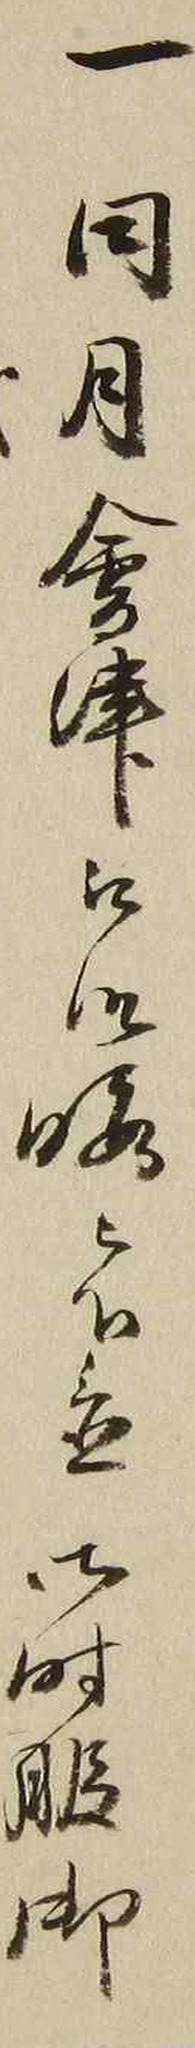一同月会津江御暇被下置御時服御
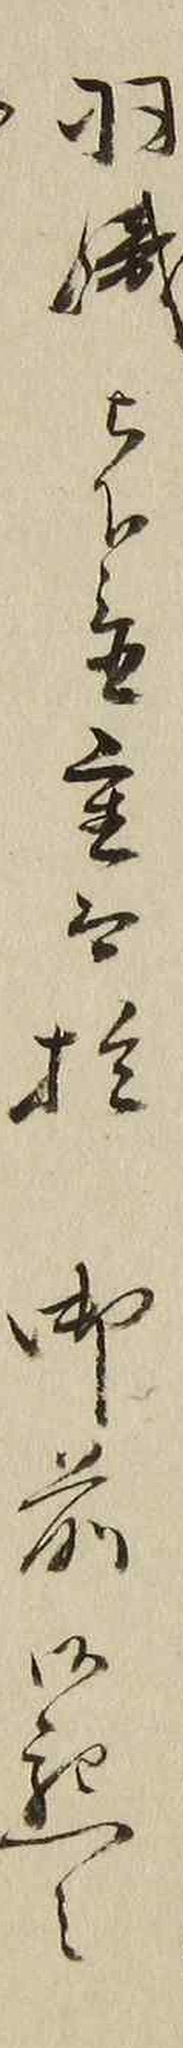羽織被下置重々於御前御懇之
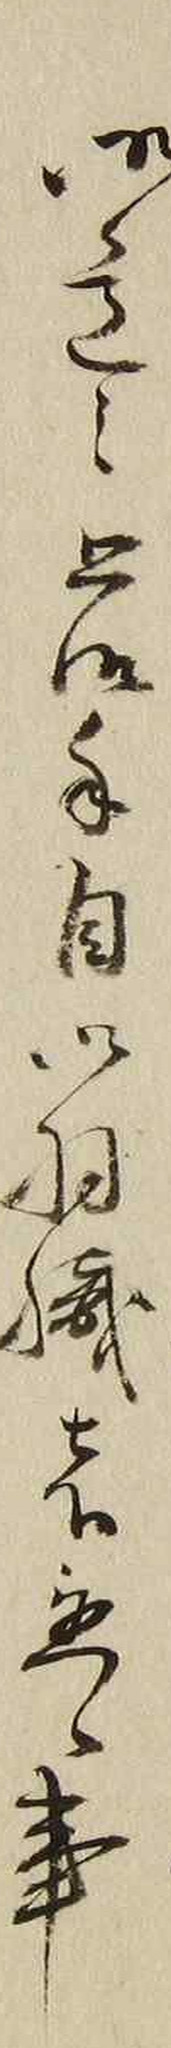御意之上御手自御羽織被下置候事
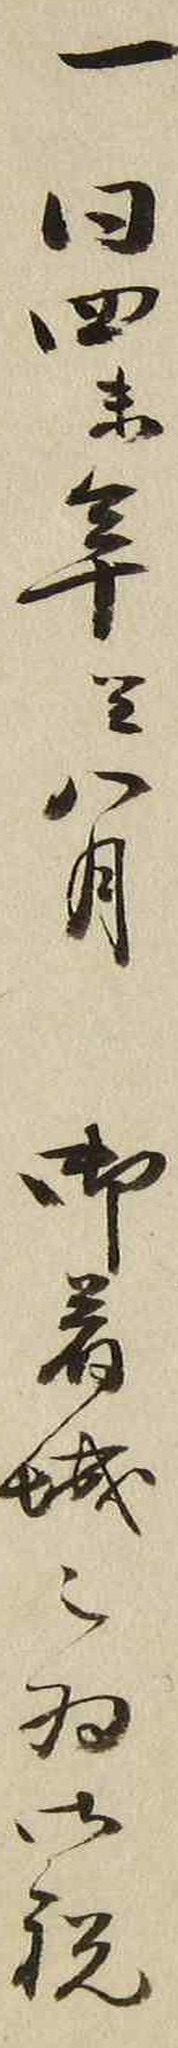一同四未年閏八月御着城之為御祝
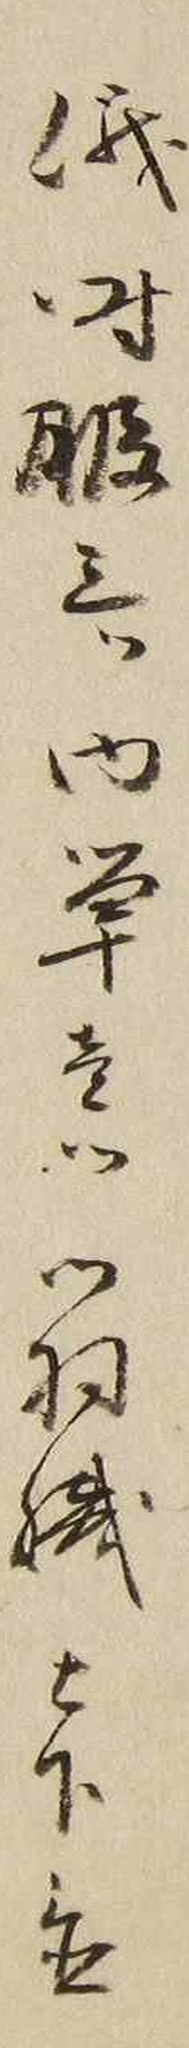儀時服三つ内単壱つ御羽織被下置
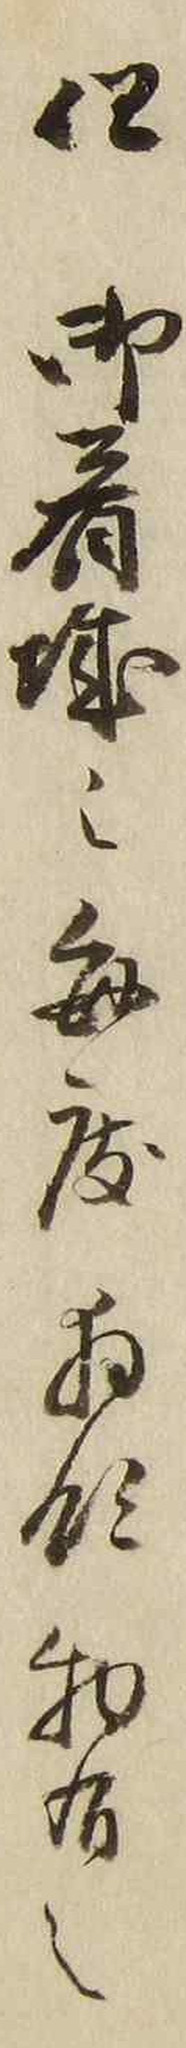但御着城之毎度拝領物有之

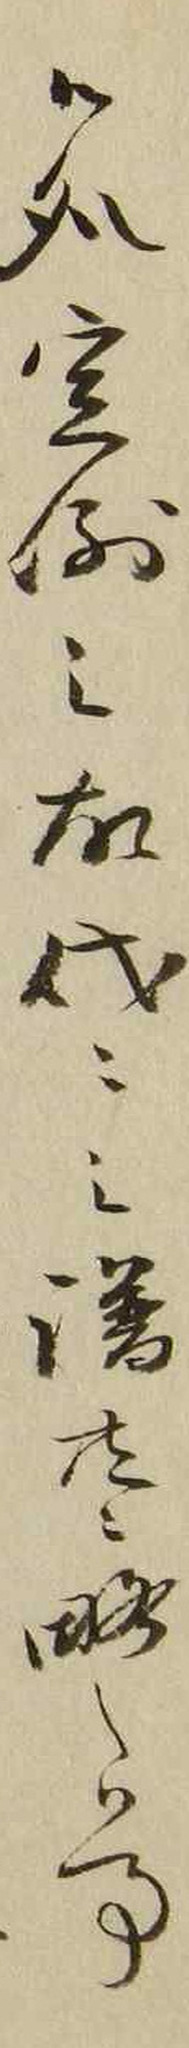候処定例之故代々之譜共に略之候事
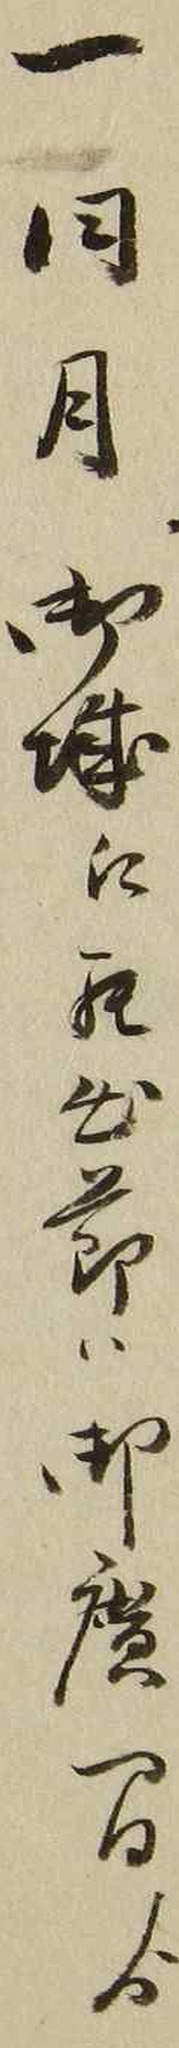一同月御城江罷出候節は御広間ゟ
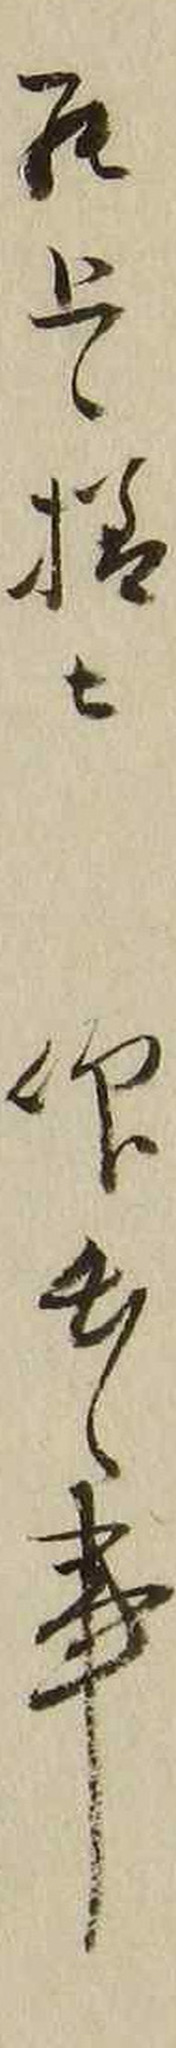罷上候様被仰出候事
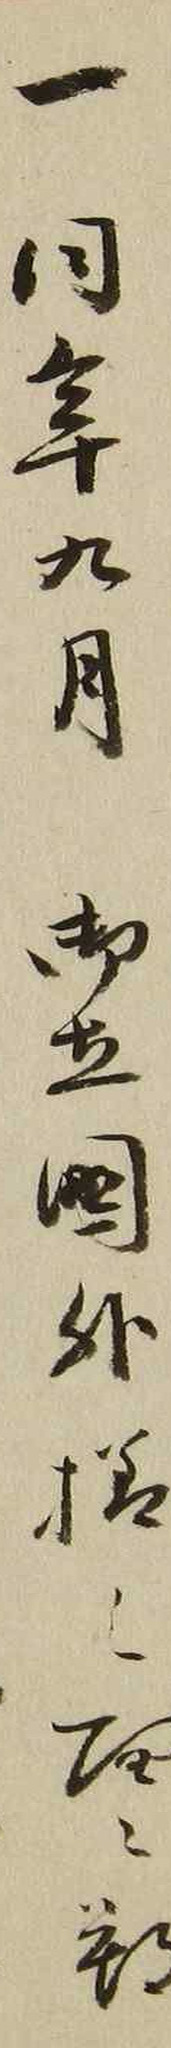一同年九月御在国外様之面々朔
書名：諸士系譜　巻之269　さ之部1
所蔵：会津若松市立会津図書館
